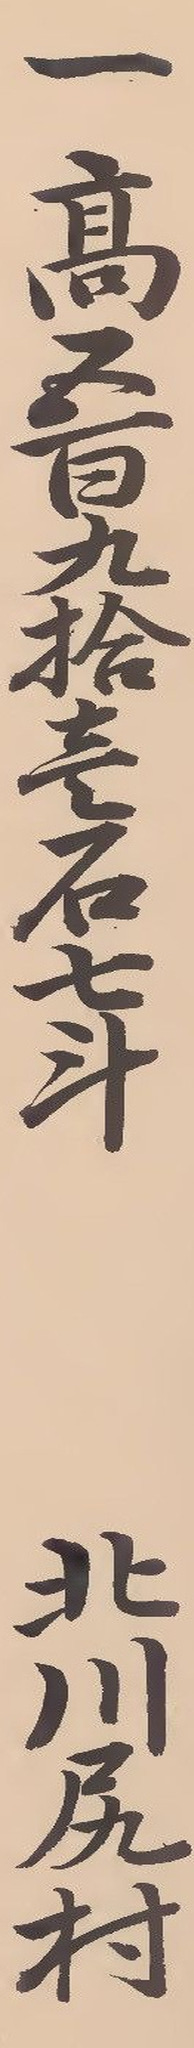一高五百九拾壱石七斗北川尻村
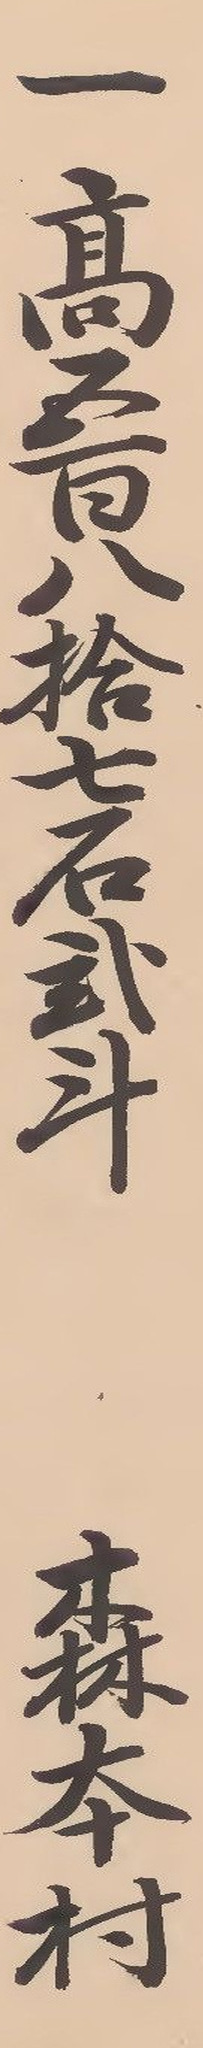一高五百八拾七石弐斗森本村
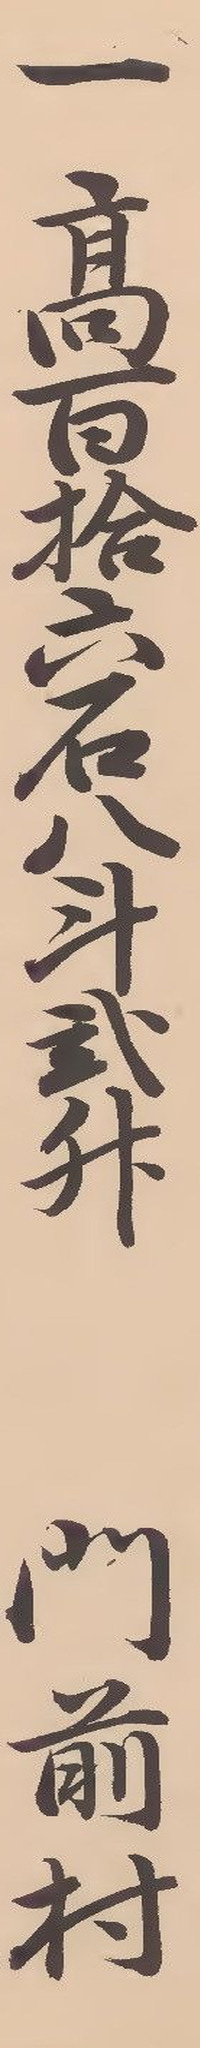一高百拾六石八斗弐升門前村

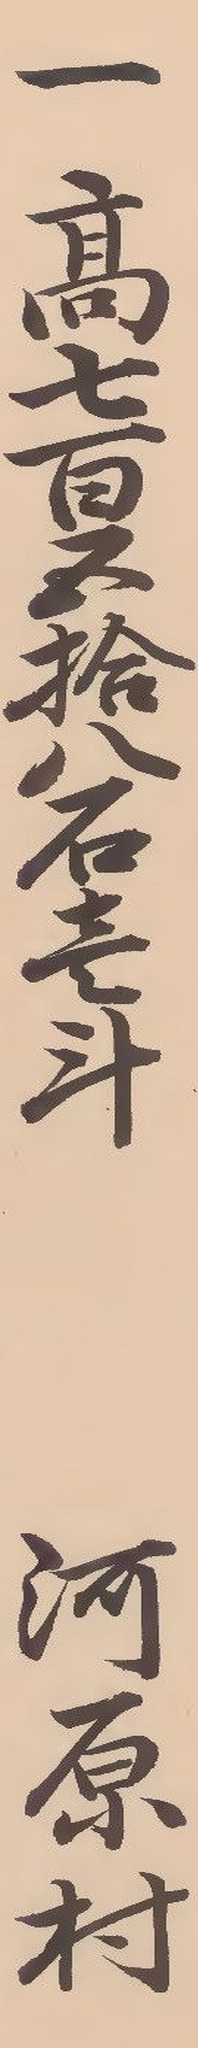一高七百五拾八石壱斗河原村
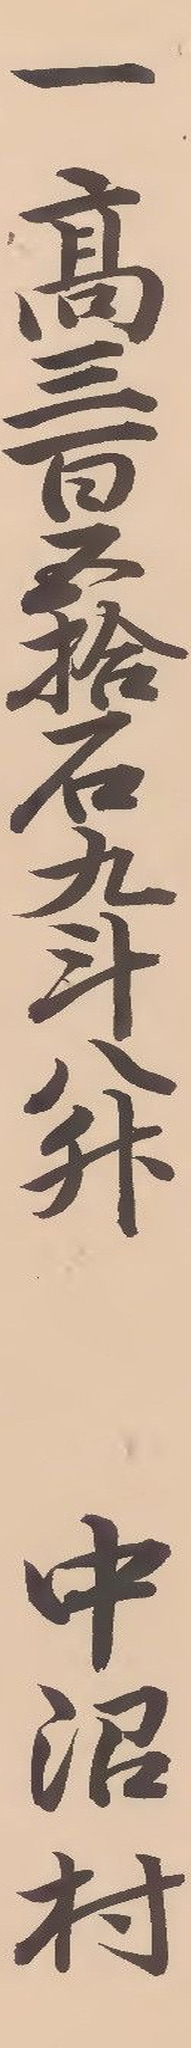一高三百五拾石九斗八升中沼村
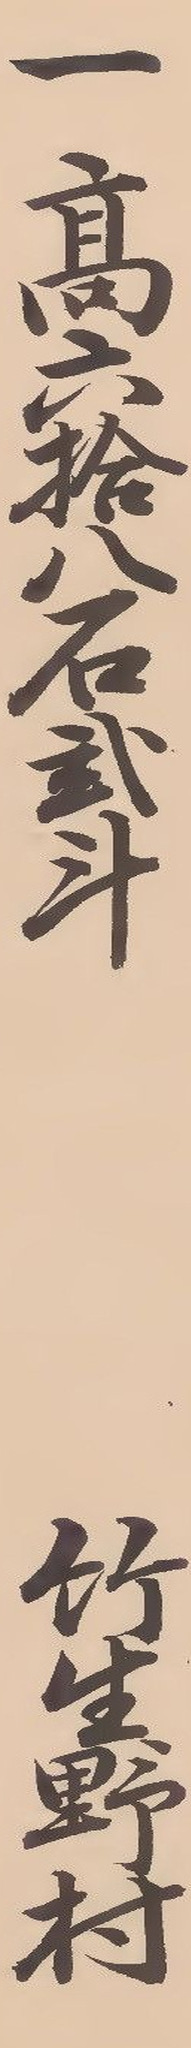一高六拾八石弐斗竹生野村
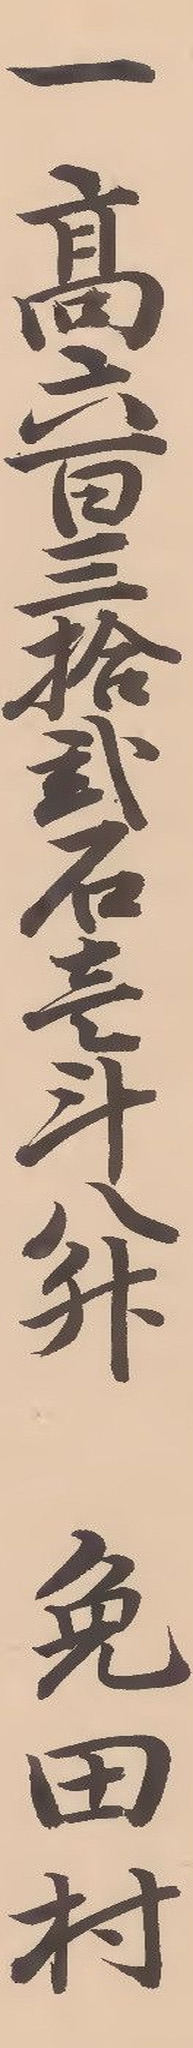一高六百三拾弐石壱斗八升免田村
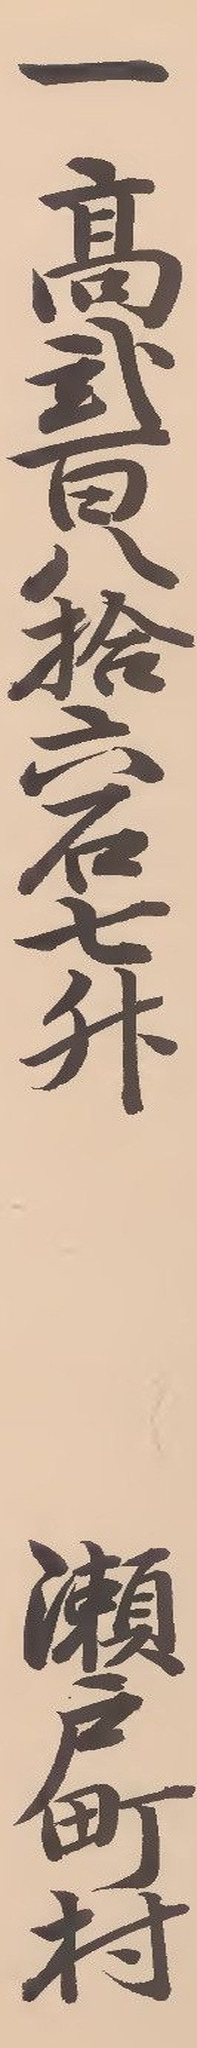一高弐百八拾六石七升瀬戸町村
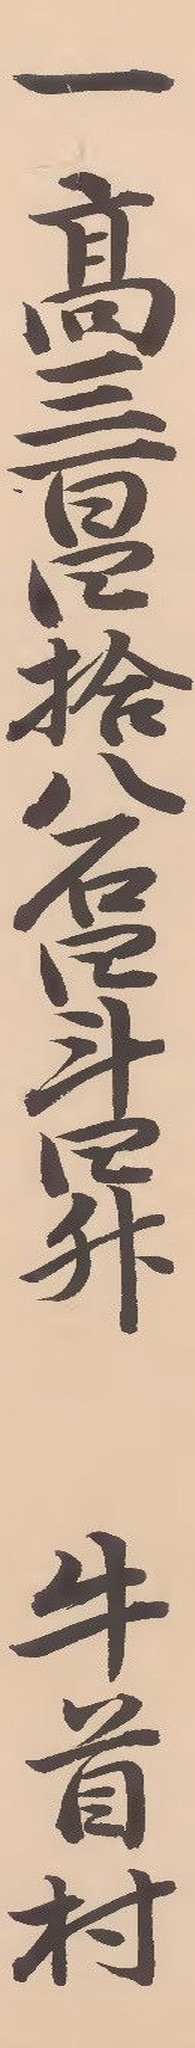一高三百四拾八石四斗四升牛首村
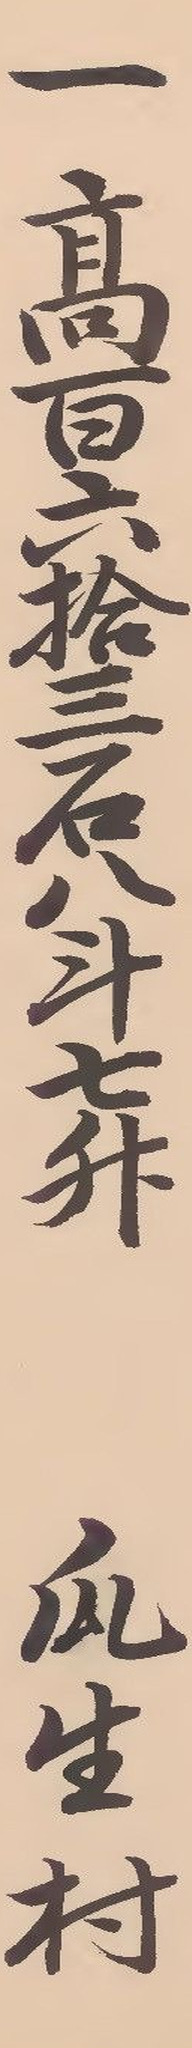一高百六拾三石八斗七升瓜生村

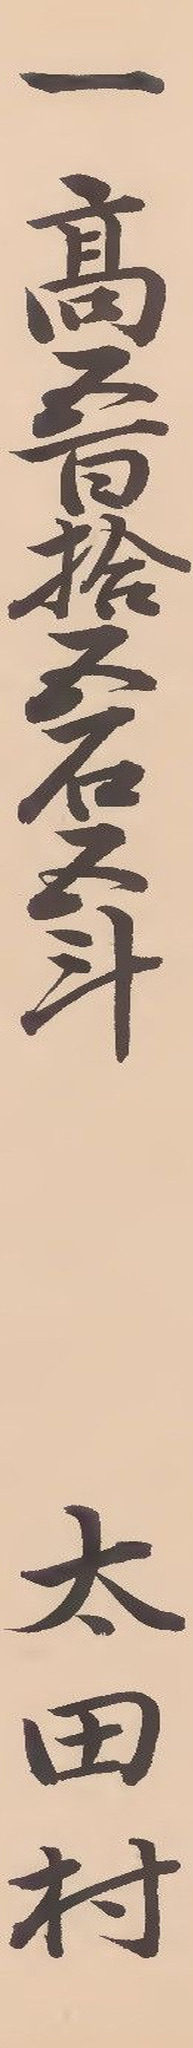一高五百拾五石五斗太田村
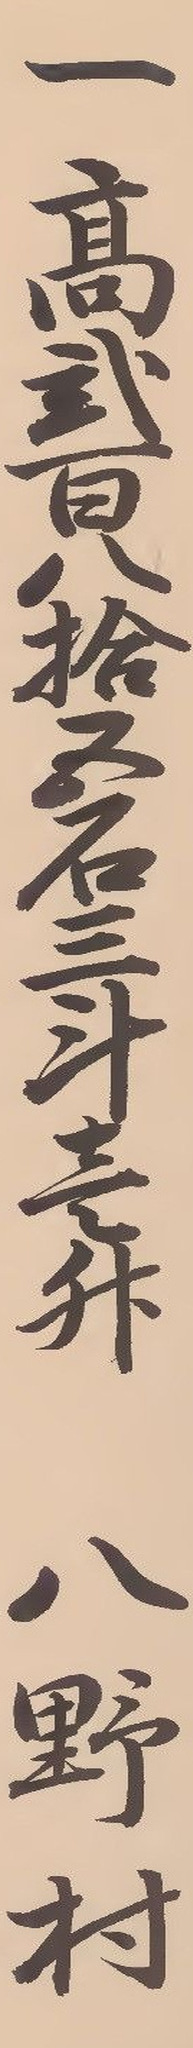一高弐百八拾五石三斗壱升八野村
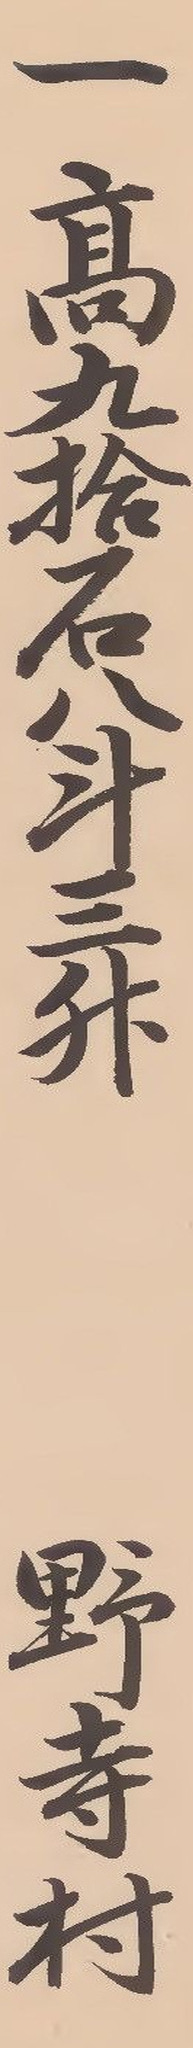一高九拾石八斗三升野寺村
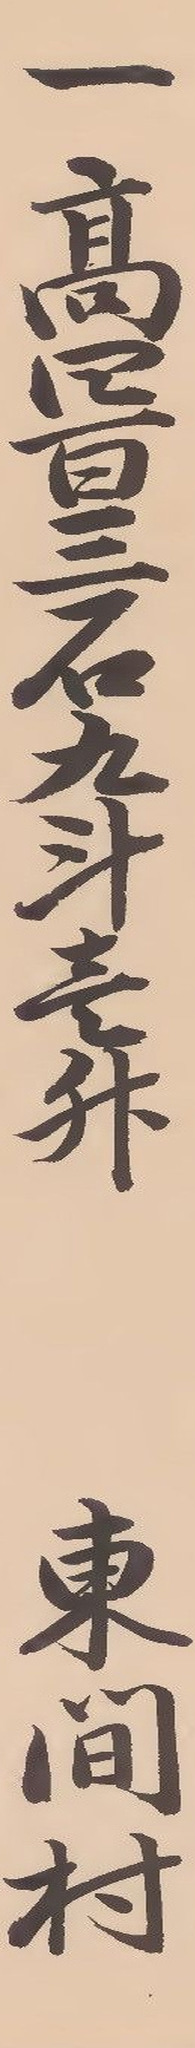一高四百三石九斗壱升東間村
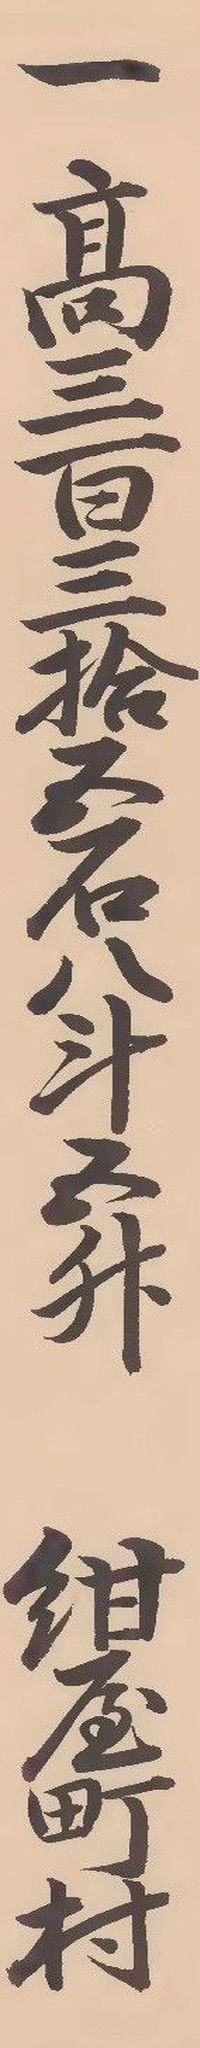一高三百三拾五石八斗五升紺屋町村

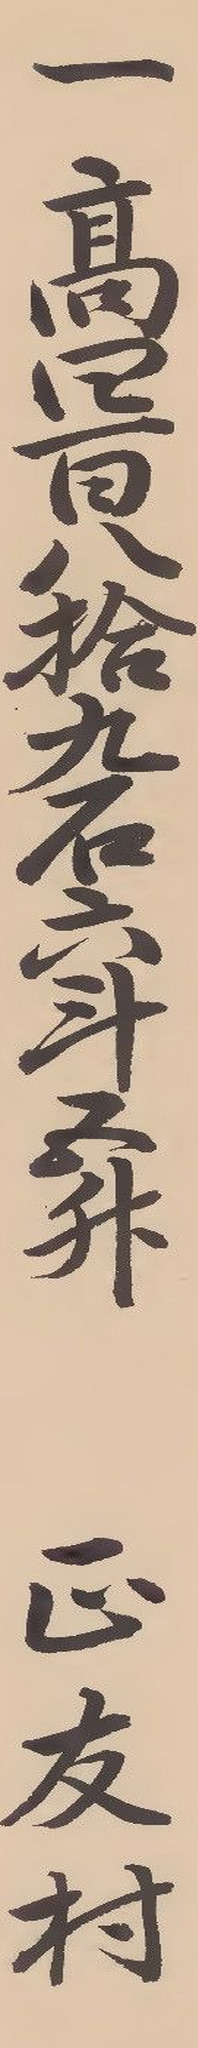一高四百八拾九石六斗五升正友村
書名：能登国郷帳
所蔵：国立公文書館 National Archives of Japan
